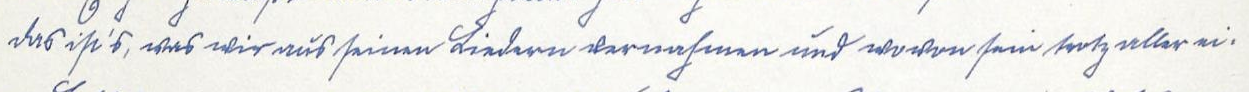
Das ist's, was wir aus seinem Leiden vernahmen und wovon sein trotz aller ei-
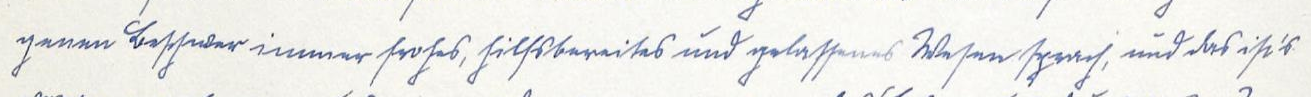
genen Beschwer immer frohes, hilfsbereites und gelassenes Wesen sprach, und das ist's
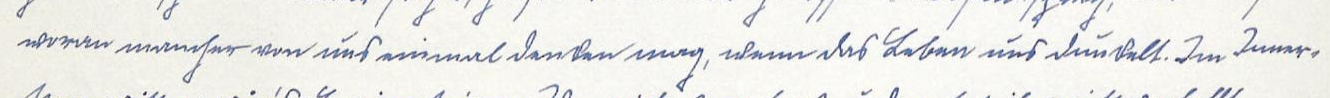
woran mancher von und einmal denken mag, wenn das Leben uns dunkelt. Im Inner-
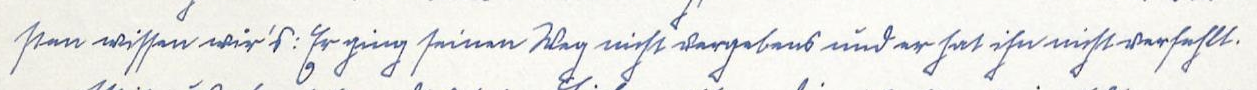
sten wissen wir's. Er ging seinen Weg nicht vergebens und er hat ihn nicht verfehlt.
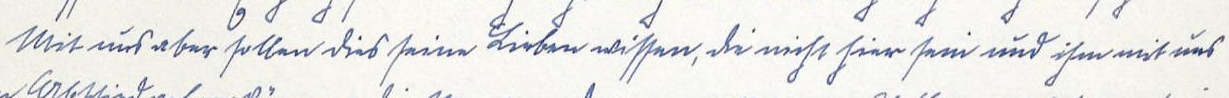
Mit uns aber sollen dies seine Lieben wissen, die nicht hier sein und ihm mit uns
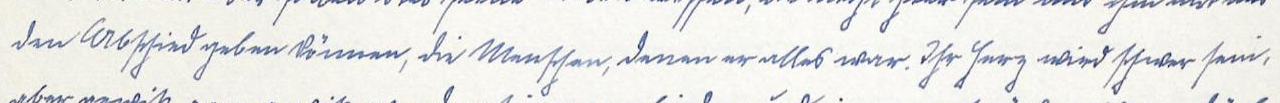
den Abschied geben können, die Menschen, denen er alles war. Ihr Herz wird schwer sein,
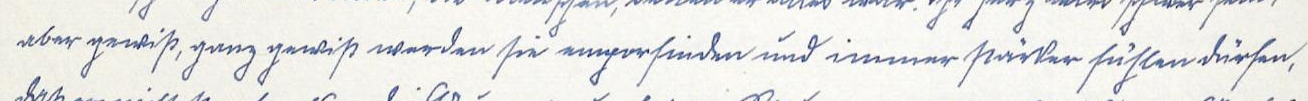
aber gewiß, ganz gewiß werden sie emporfinden und immer starker fühlen dürfen,
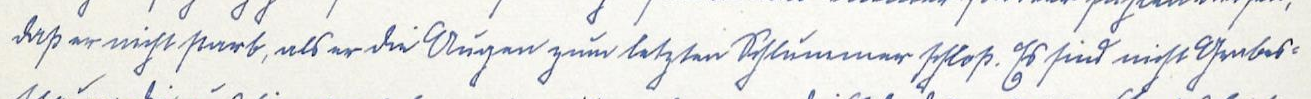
dass er nicht starb, als er die Augen zum letzten Schlummer schloß. Es sind nicht Grabes-
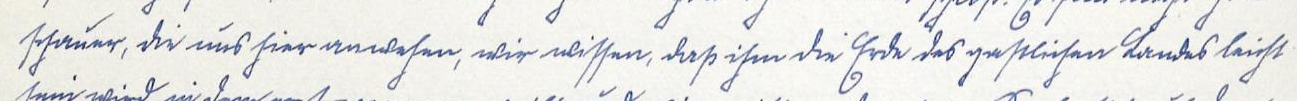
schauer, die uns hier anwehen, wir wissen, dass ihm die Erde des gastlichen Landes leicht
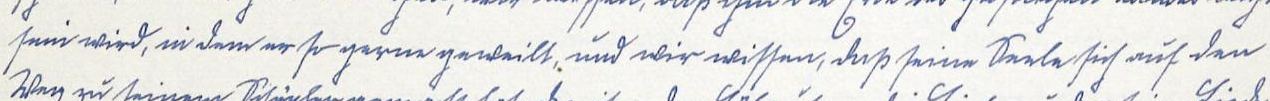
sein wird, in dem er so gerne geweilt „und wir wissen, daß seine Seele sich auf den
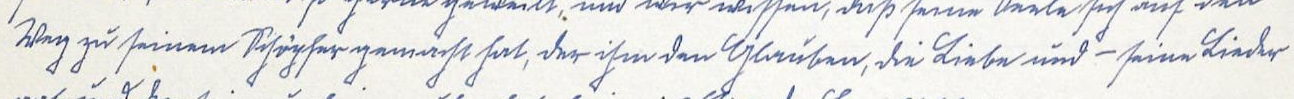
Wer zu seinem Schöpfer gemacht hat, der ihm den Glauben, die Liebe und - seine Lieder
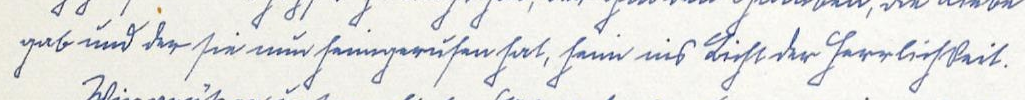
gab und der sie nun heimgerufen hat, heim ins Licht der Herrlichkeit.
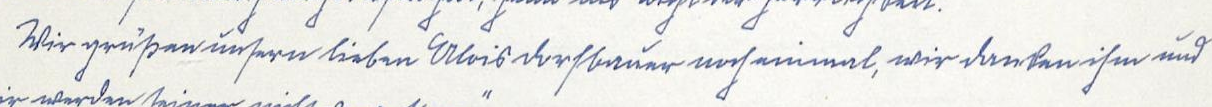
Wir grüßen unseren lieben Alois Dorfbauer noch einmal, wir danken ihm und
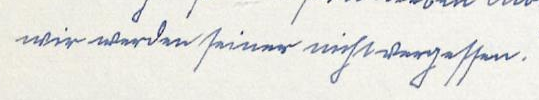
wir werden seiner nicht vergessen
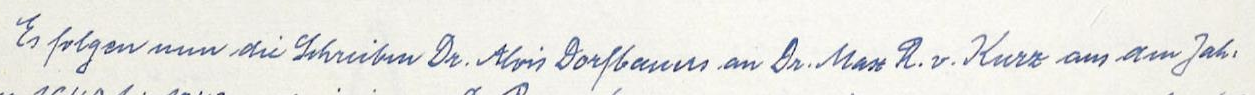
Es folgen nun die Schreiben Dr. Alois Dorfbauers an Dr. Max R. v. Kurz aus den Jah-
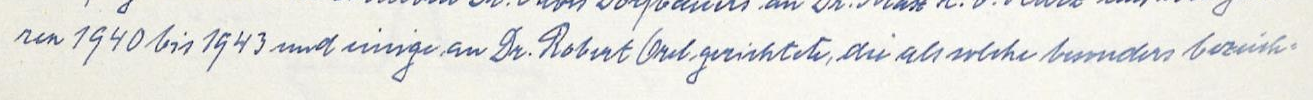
ren 1940 bis 1943 und einige an Dr. Robert Orel gerichteten, die als solcher besonders bezeich-
